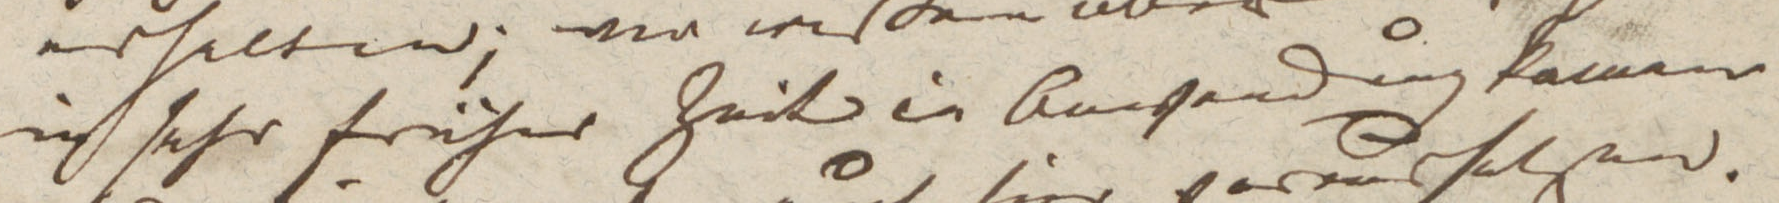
in sehr früher Zeit in Anwendung kamen
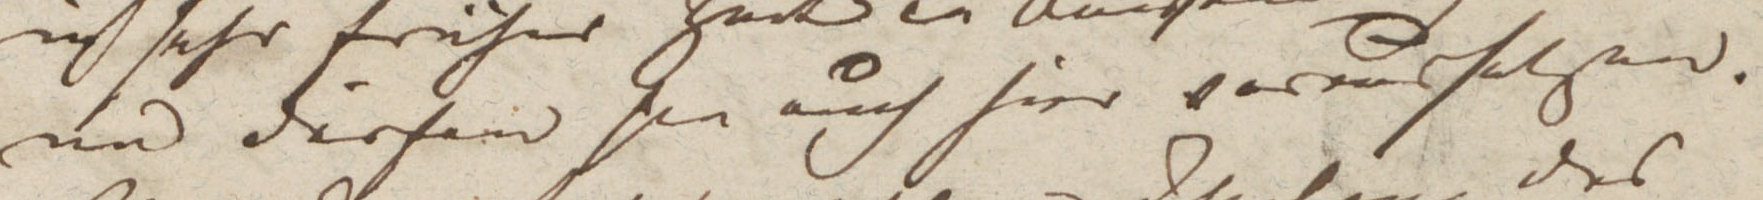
und dürfen sie auch hier voraussetzen.
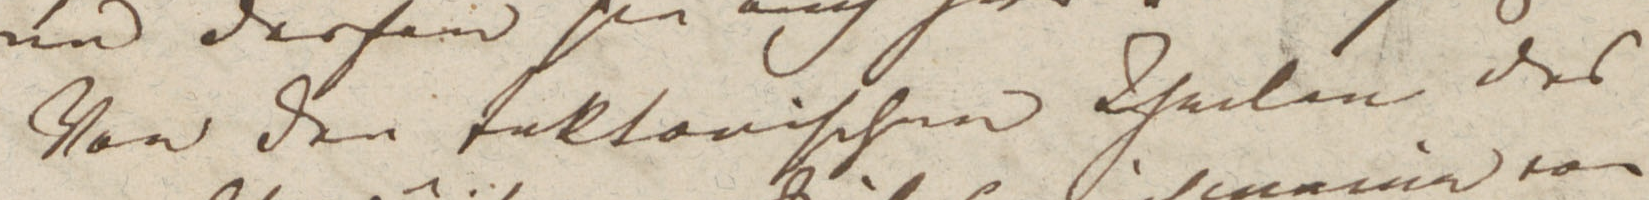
Von den tektonischen Theilen des
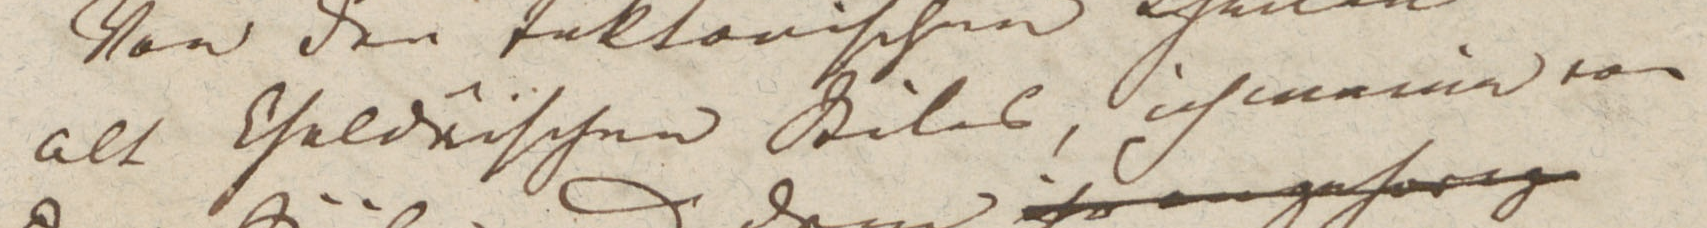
alt Chaldäischen Stiles, ich meine von
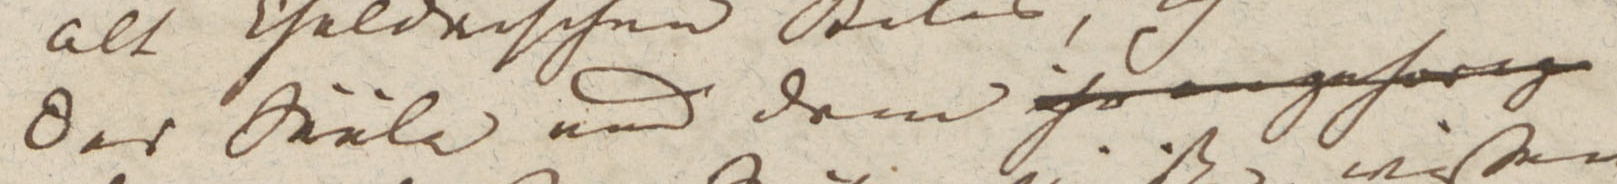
der Säule und dem ihr angehorig
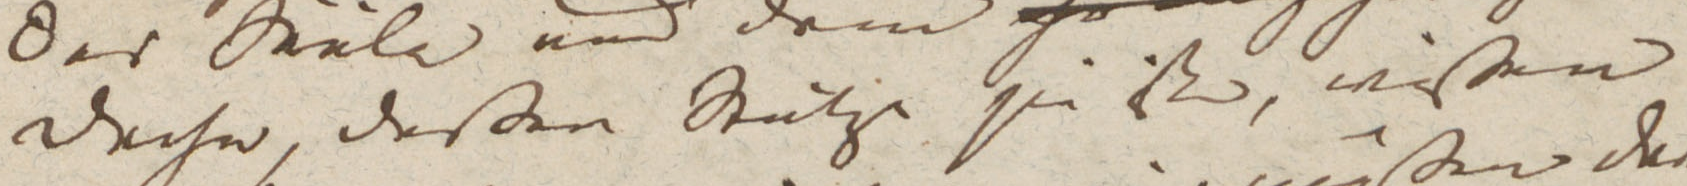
Dache, dessen Stütze sie ist, wissen
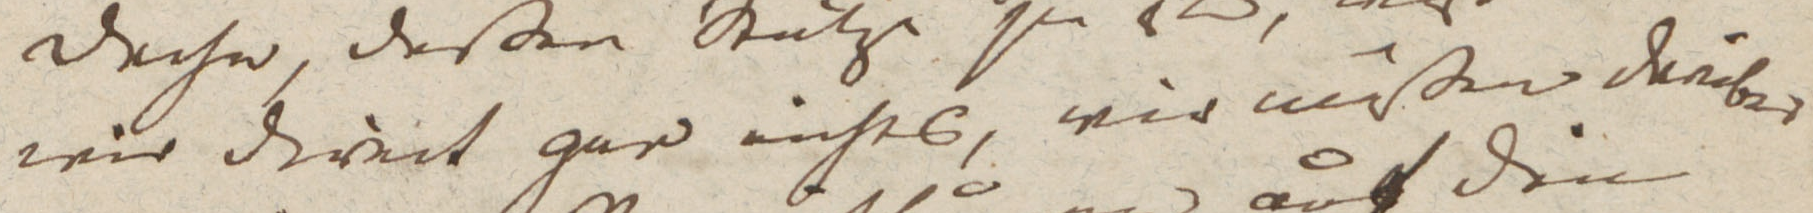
wir direct gar nichts, wir müssen darüber
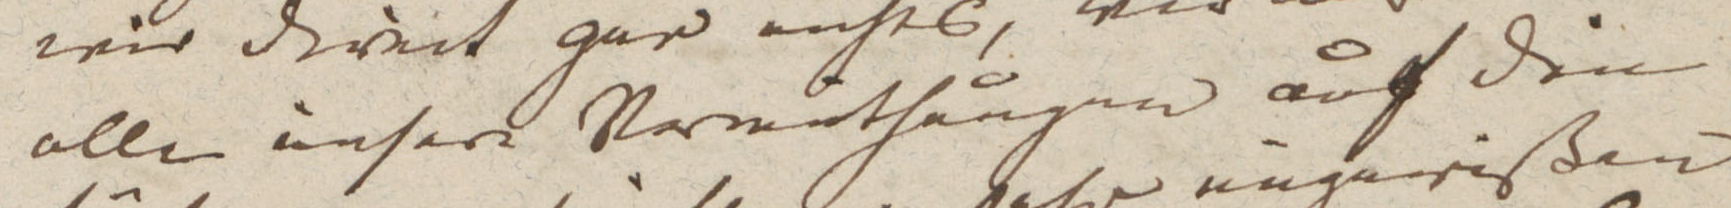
alle unsere Vermuthungen ausf die
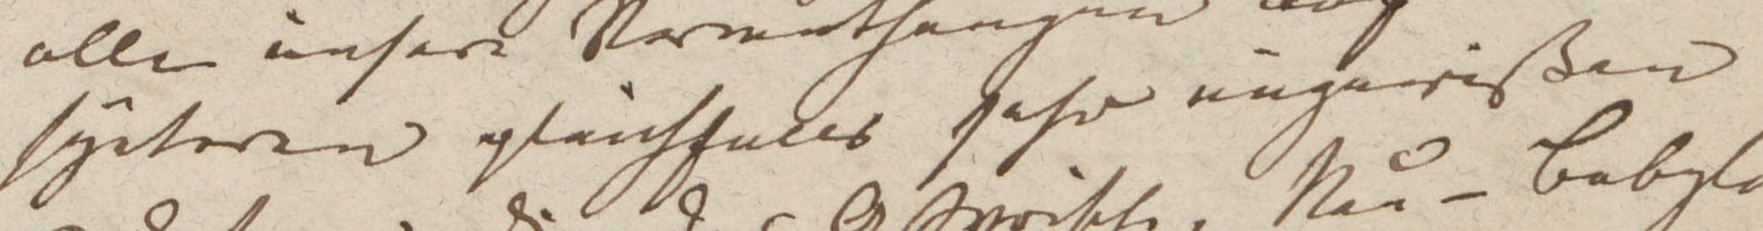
späteren gleichfalls sehr ungewissen
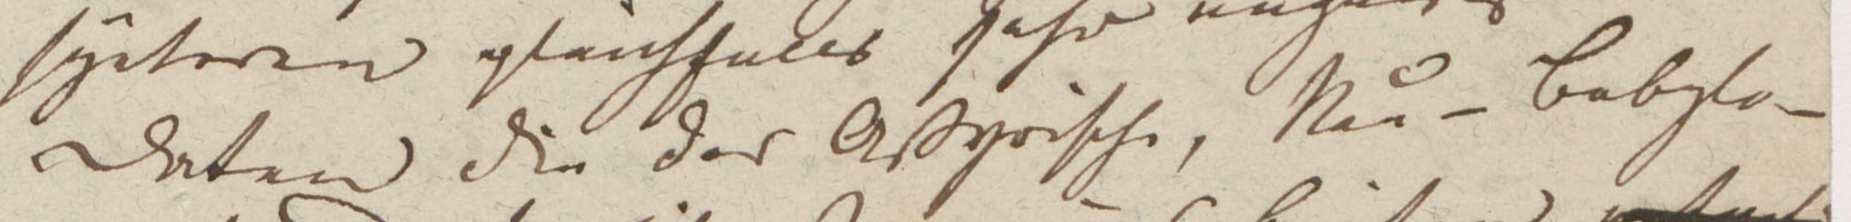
Daten die der Assyrische, Neu-Babylo-
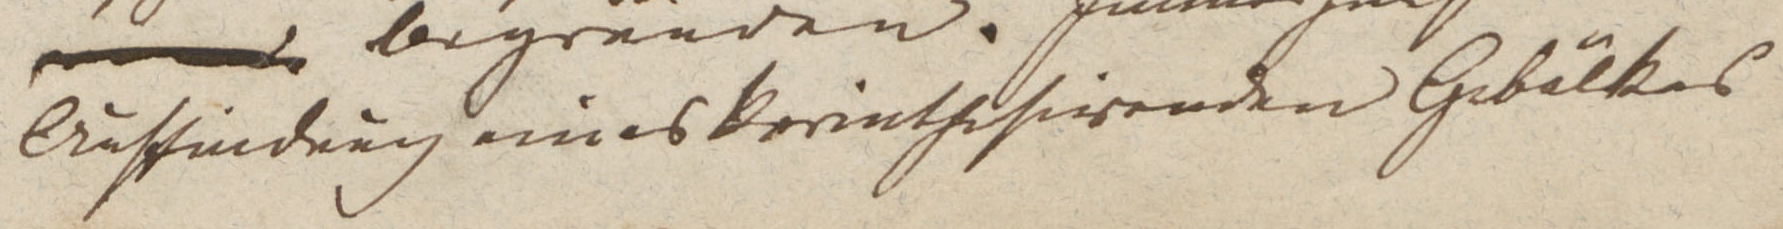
Auffindung eines korinthisirenden Gebälkes
